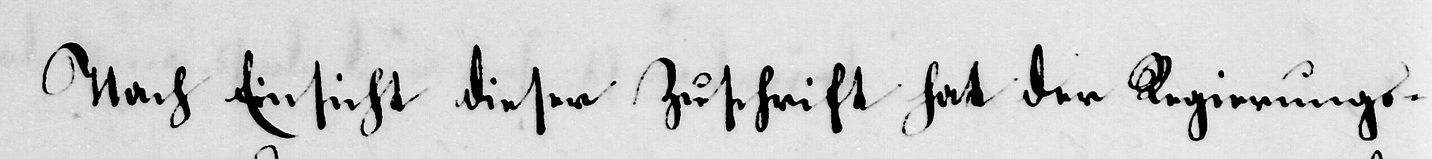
Nach Einsicht dieser Zuschrift hat der Regierungs¬
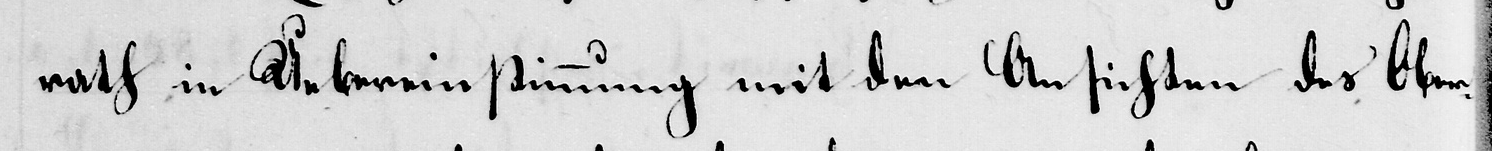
rath in Uebereinstimmung mit den Ansichten des Ober¬
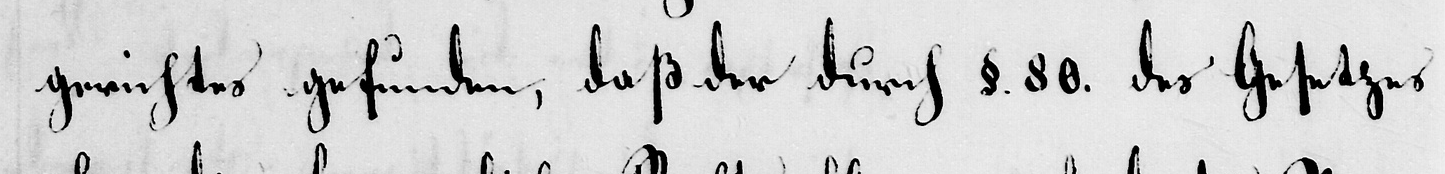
gerichtes gefunden, daß der durch §. 80. des Gesetzes
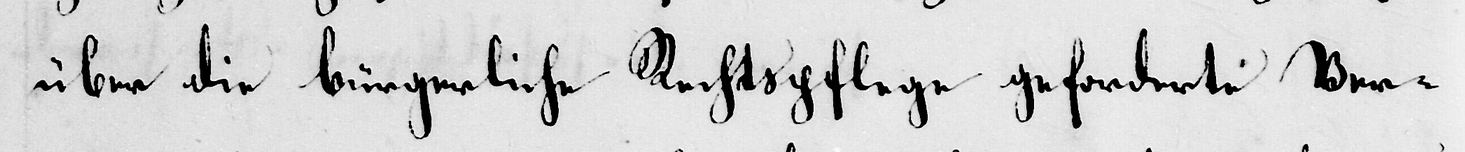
über die bürgerliche Rechtspflege geforderte Ver¬
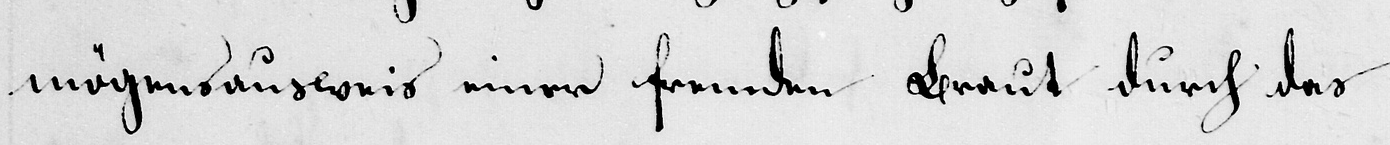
mögensausweis einer fremden Braut durch das
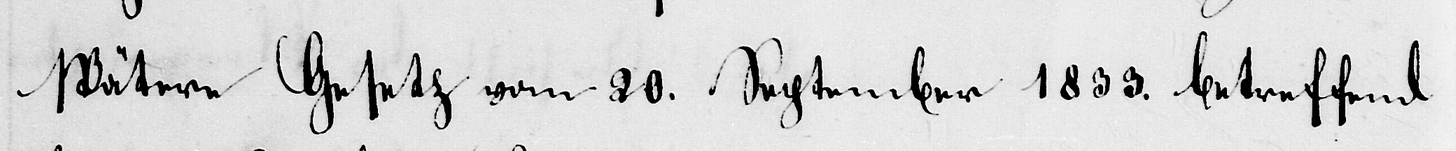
spätere Gesetz vom 20. September 1833. betreffend
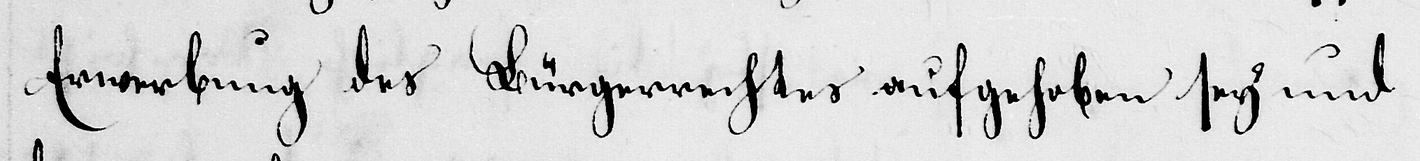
Erwerbung des Bürgerrechtes aufgehoben sey und
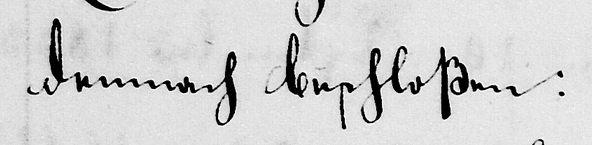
demnach beschloßen:
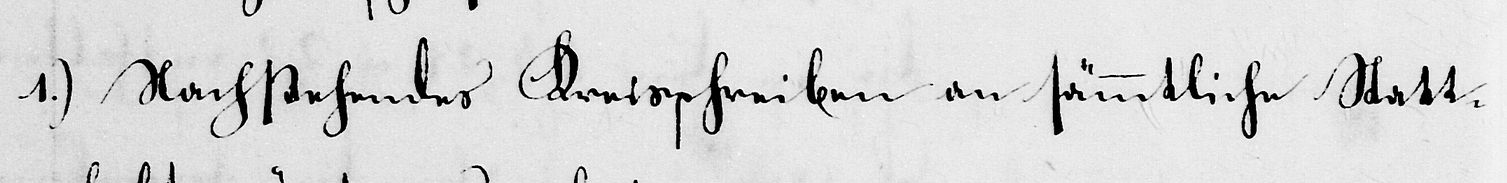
1.) Nachstehendes Kreisschreiben an sämmtliche Statt¬
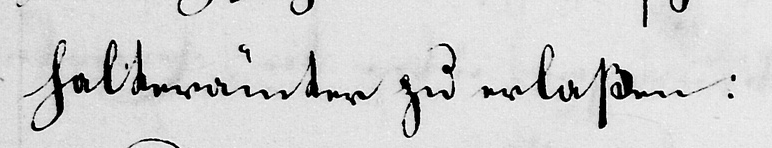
halterämter zu erlaßen:
